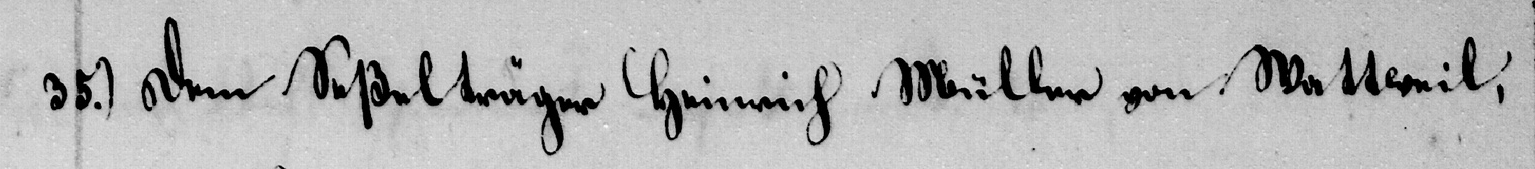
35.) Dem Seßelträger Heinrich Müller von Wattweil,
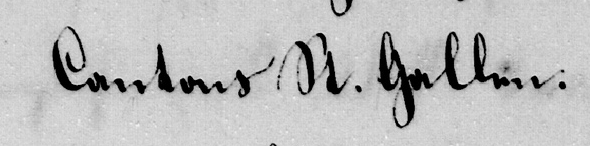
Cantons St. Gallen.
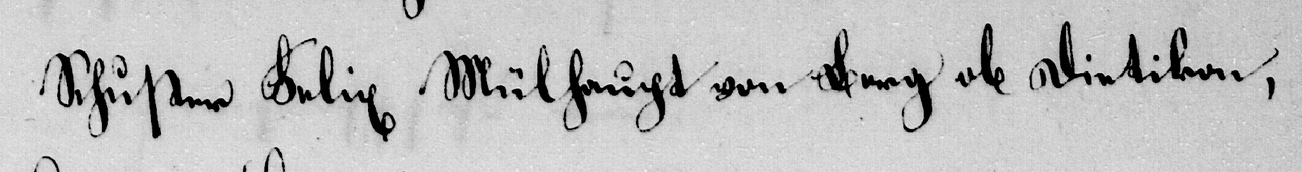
Schuster Felix Mülhaupt von Berg ob Dietikon,
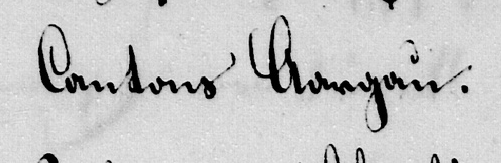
Cantons Aargau.
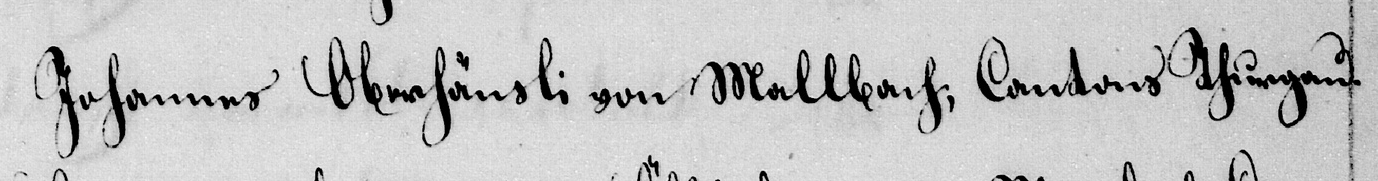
Johannes Oberhänsli von Mallbach, Cantons Thurgau.
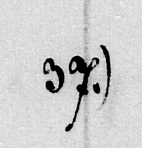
37.)
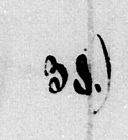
38.)
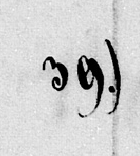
39.)
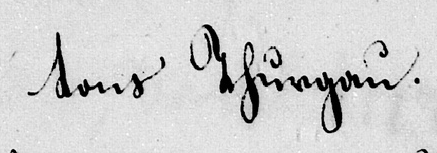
tons Thurgau.
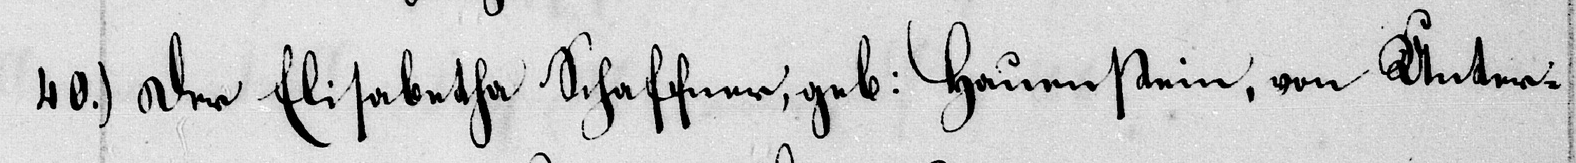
40.) Der Elisabetha Schaffner, geb: Hauenstein, von Unte¬
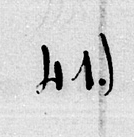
41.)
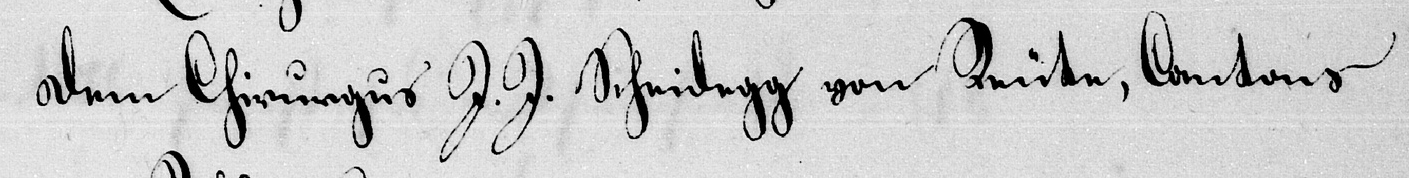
Dem Chirurgus J. J. Scheidegg von Reute, Cantons
